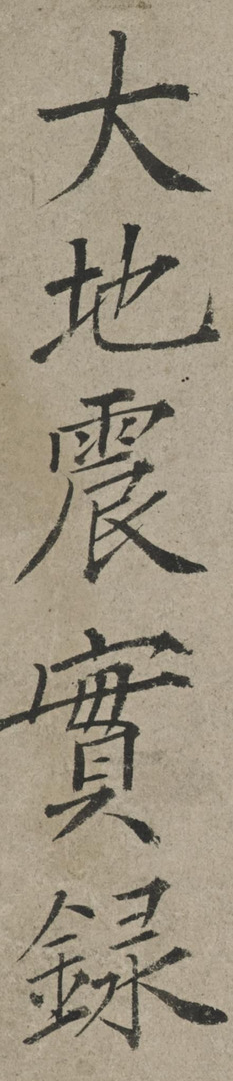大地震実録

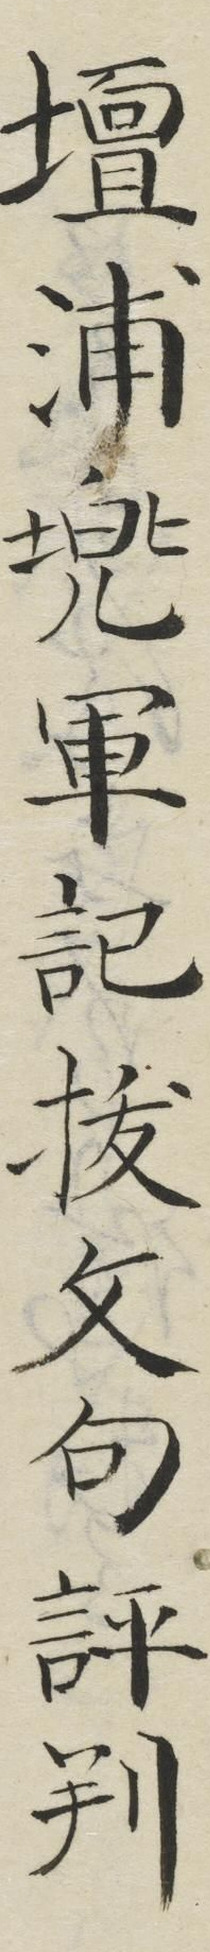壇浦兜軍記祓文句評判

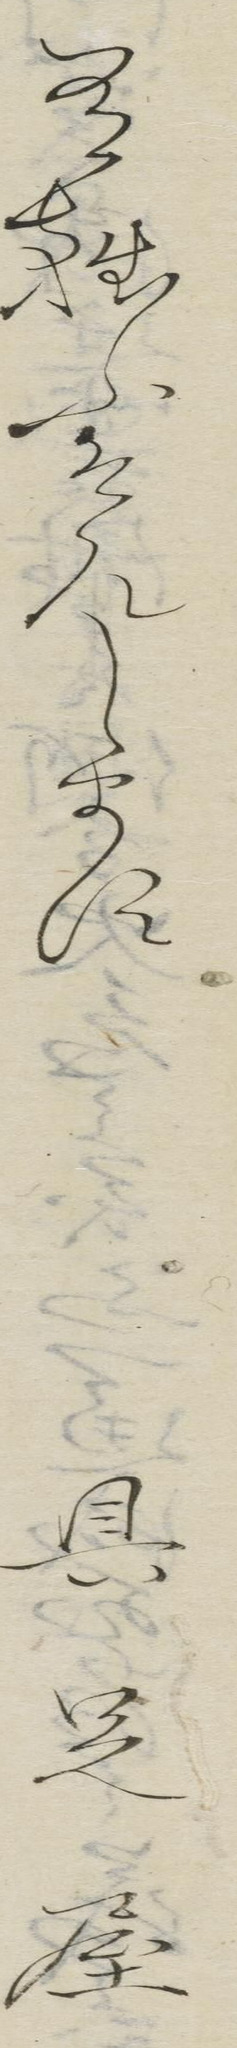有難ふたんします具足屋
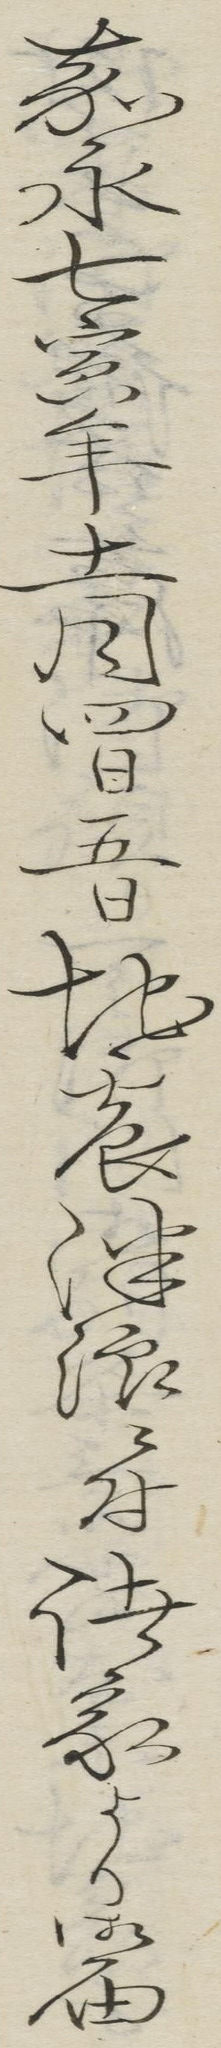嘉永七寅年十一月四日五日地震津浪ニ付諸家より御届
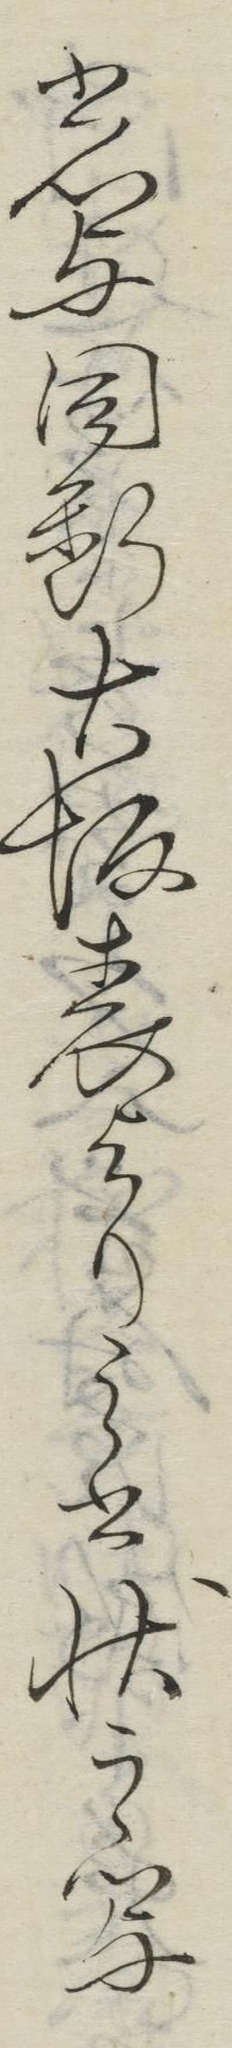書写同断大坂表より之書状之写
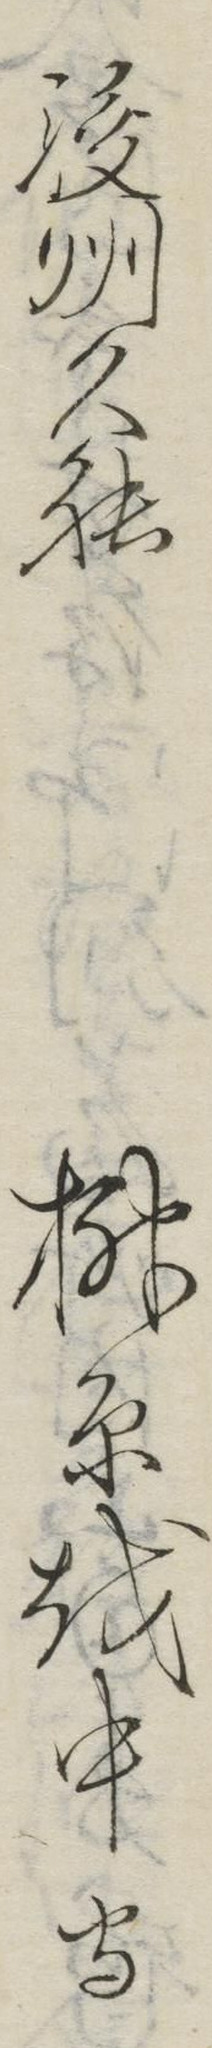駿州久能榊原越中守
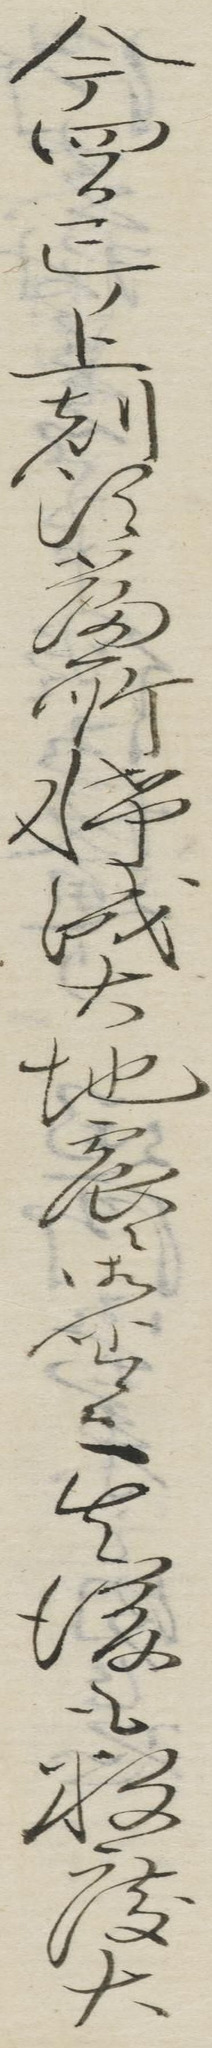今四日巳ノ上刻頃當所稀成大地震ニ御座候而其後も数度大
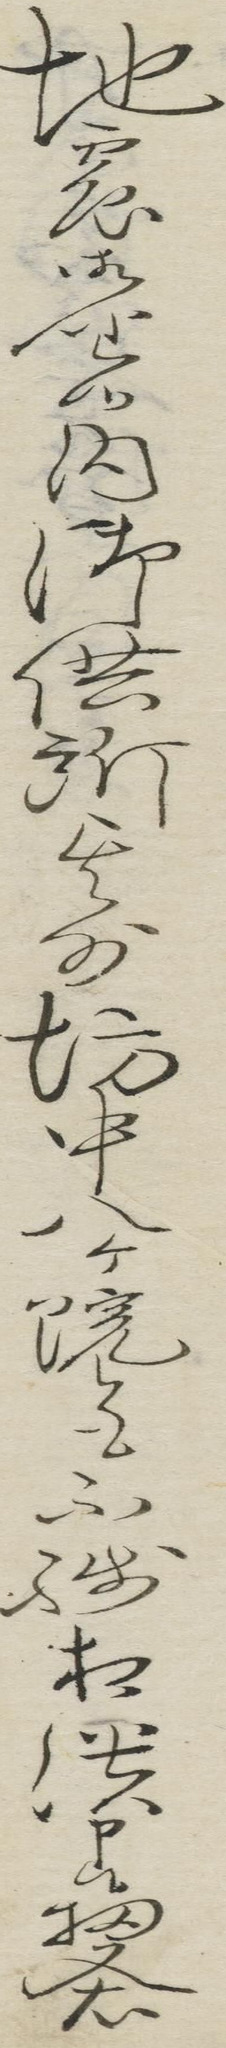地震御座候内御供所其外坊中八ケ院とも不残相潰申候扨又右
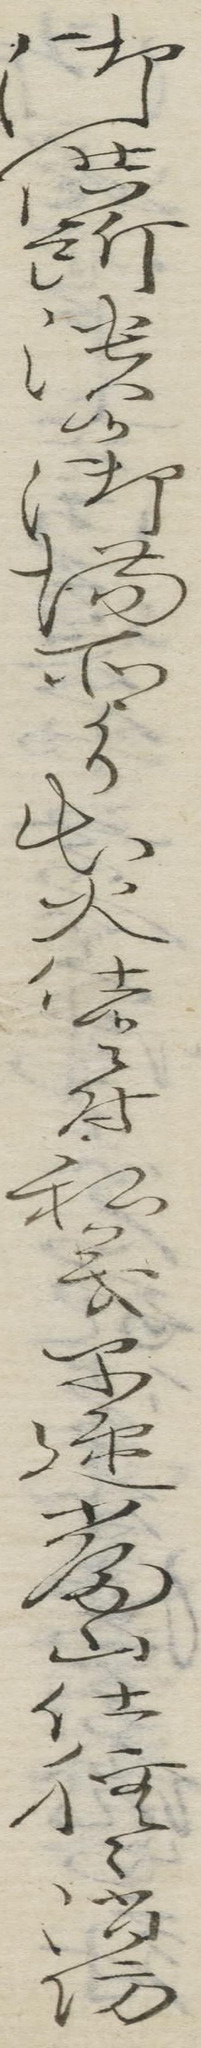御供所潰候御場所より出火仕候ニ付私義早速當山仕種々消防
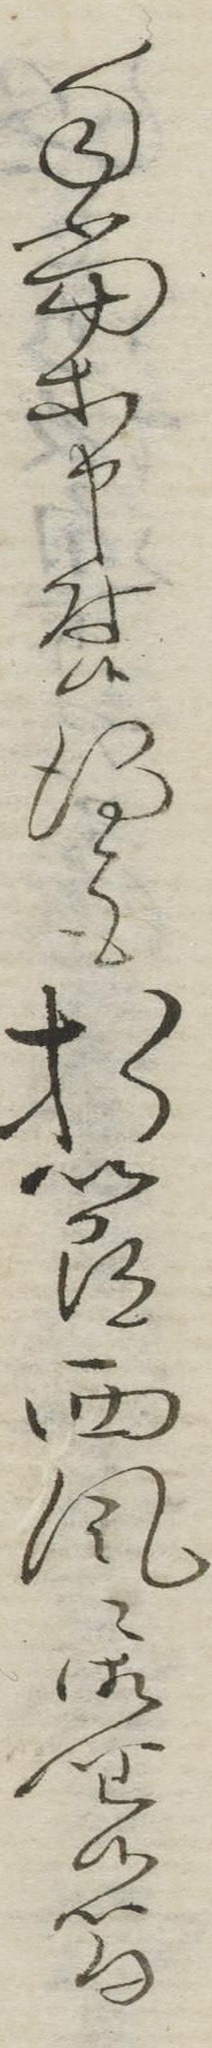手当等申付候得とも折節西風ニ御座候間
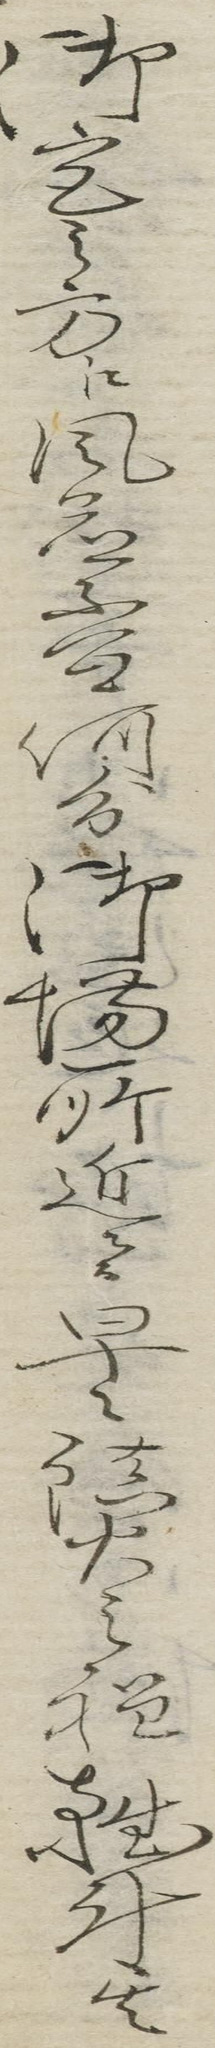御宮之方え風応不宜何分御場所近ニ而早々鎮火之程難斗其

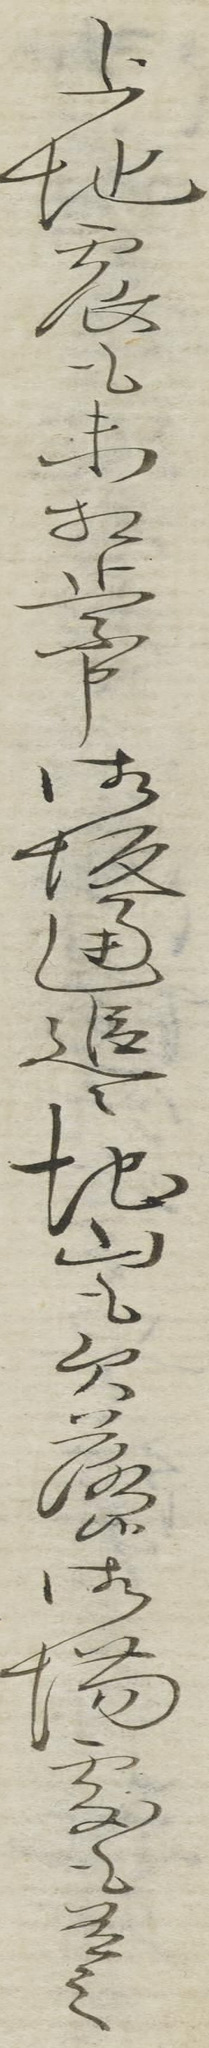上地震未相止不申御坂通追々地山も欠落候御場処も有之
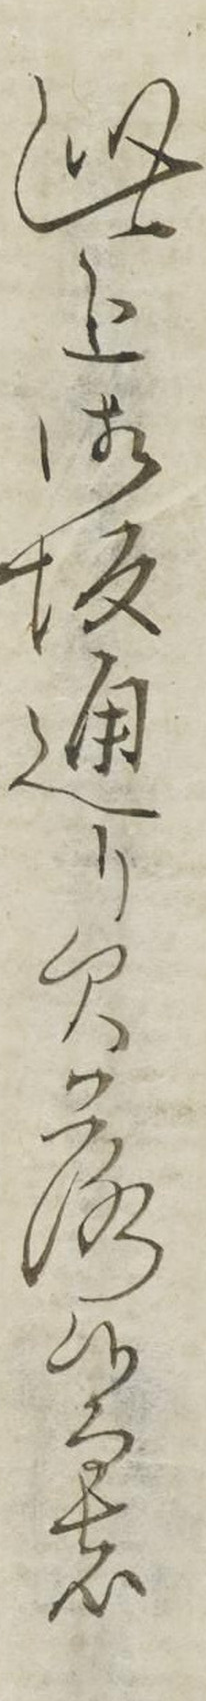此上御坂通り欠落候而は
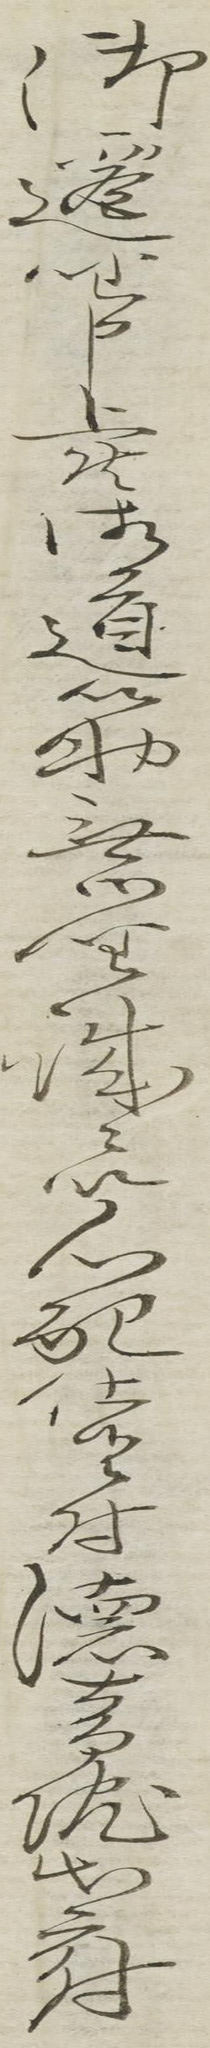御遷座申上候御道筋無御座誠ニ以心配仕候ニ付徳音院出府
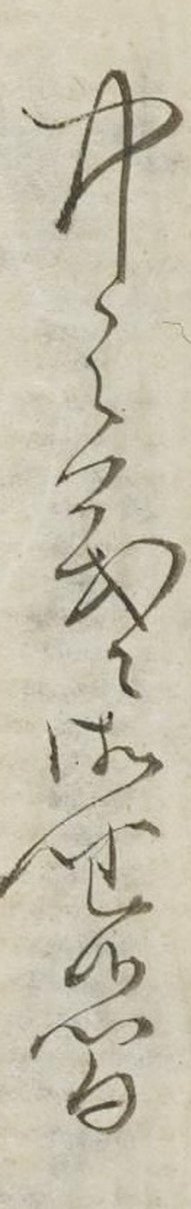中之義ニ御座候間
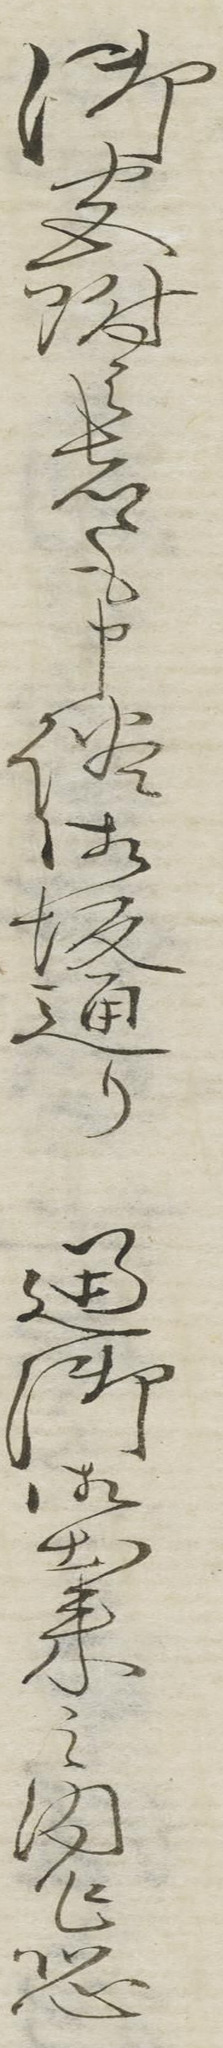御宮付之者へも申談御坂通り通御御出来之内乍恐
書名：大地震實録
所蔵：東京大学地震研究所図書室 Earthquake Research Institute Library, The University of Tokyo, JAPAN
